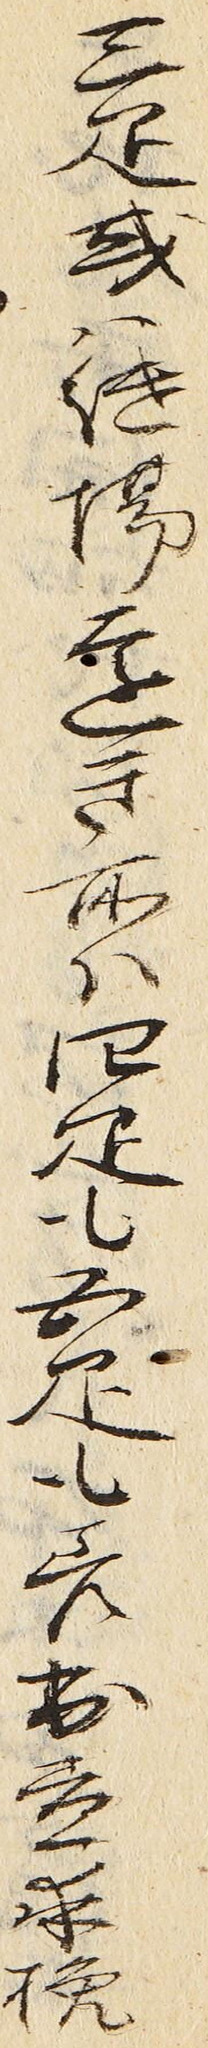三疋或は継場遠き所は四疋も五疋も差出昼夜挽
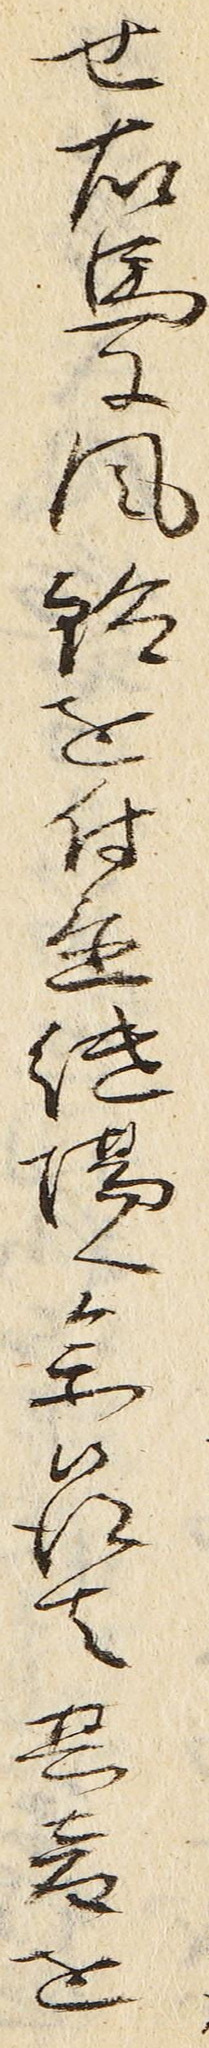せ右馬に風鈴を付置継場へ参候得は其音を
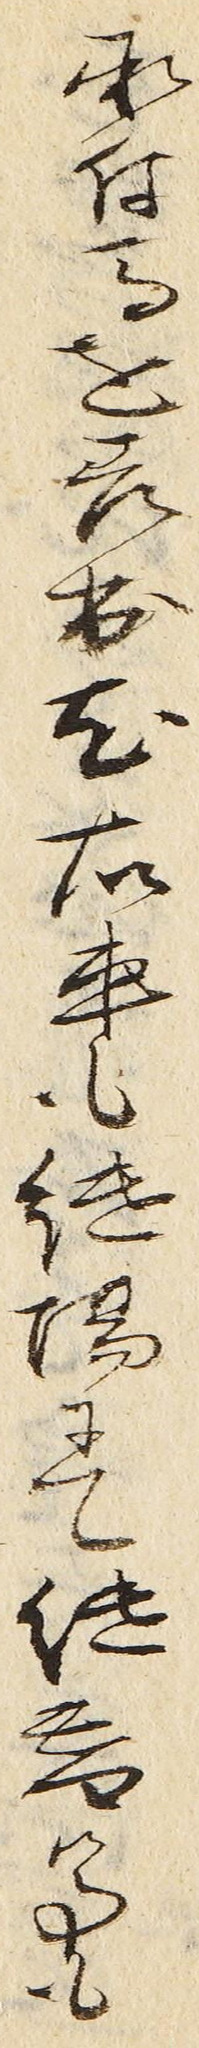承付馬を差出尤右車も継場にて継替候事も
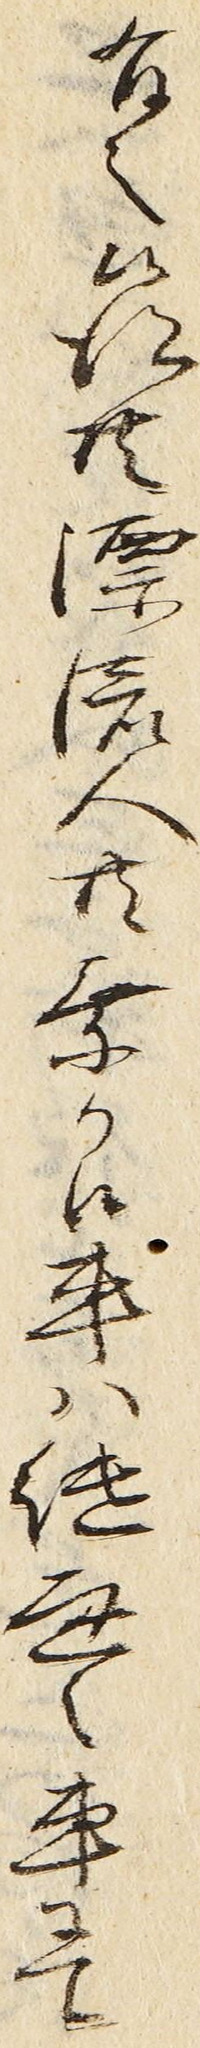有之候得共漂流人共乗り候車は継通之車にて
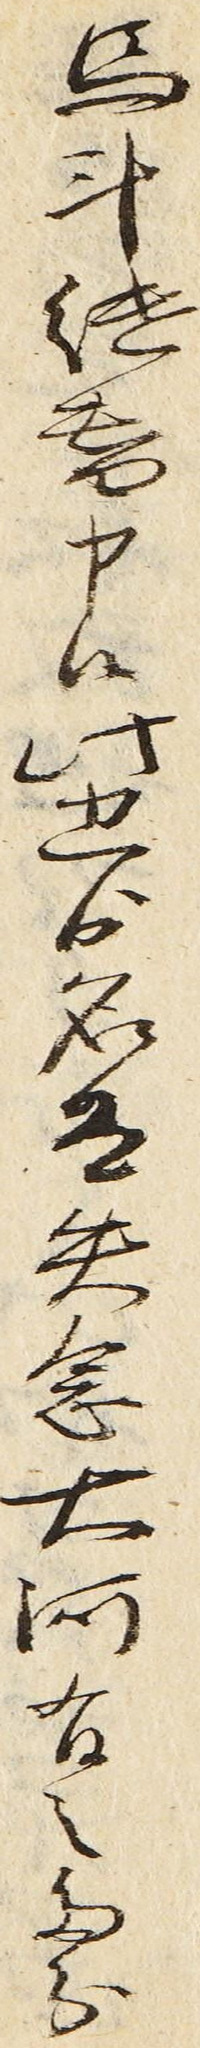馬斗継替申候此辺ゟ名は失念大河有之多分
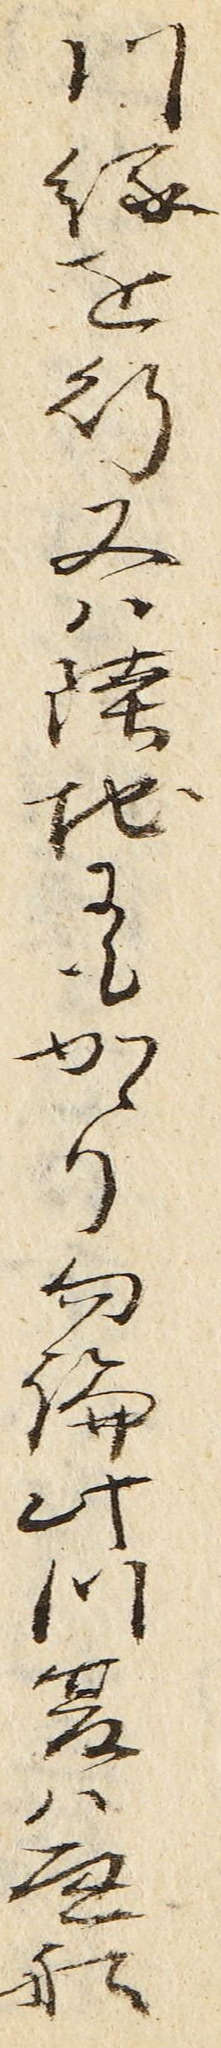川縁を行又は陸地にもかゝり勿論此川夏は通船
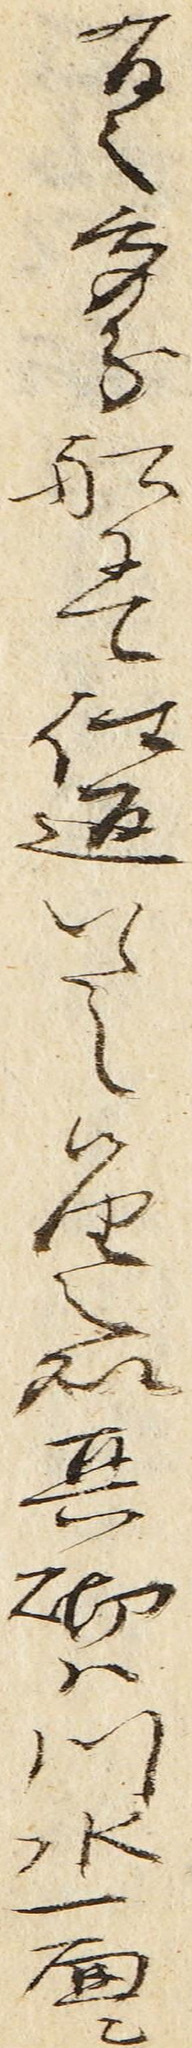有之多分船にて往返いたし候由之処其砌は川水一面に
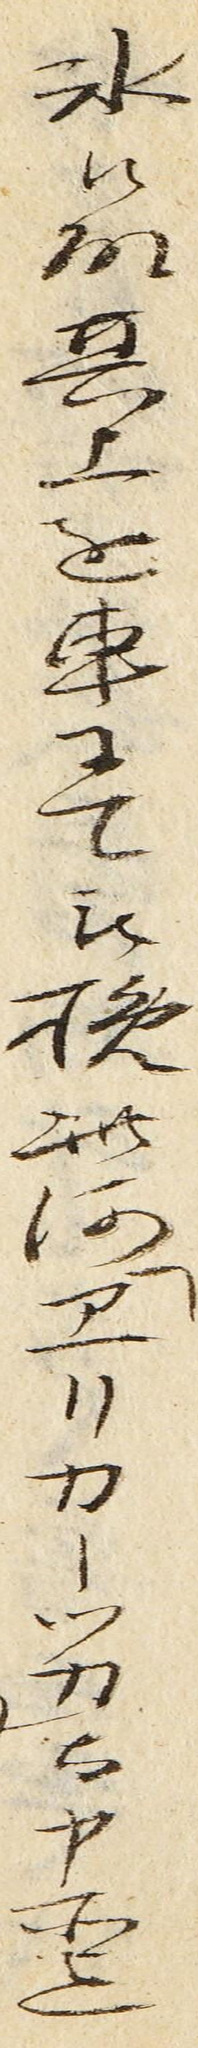氷候故其上を車にて被挽此川「ヱリカーツカ」と申所迄
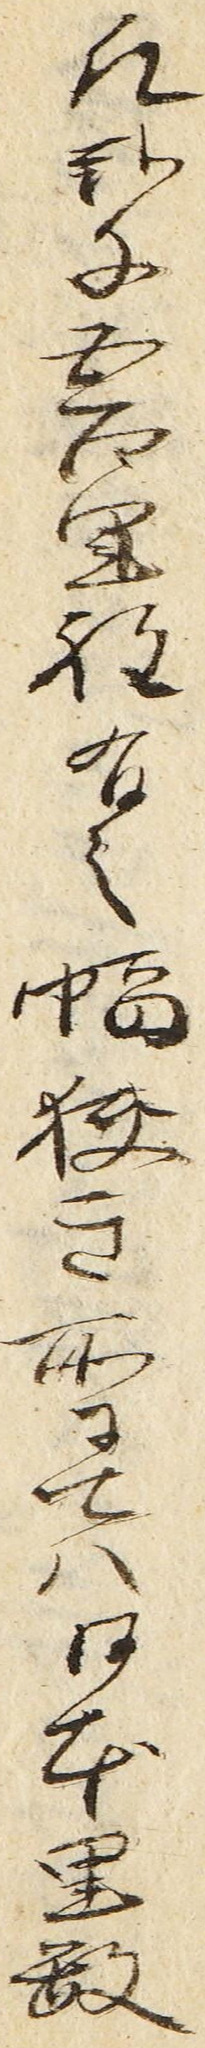凡弐千五百里程有之幅狭き所にては日本里数
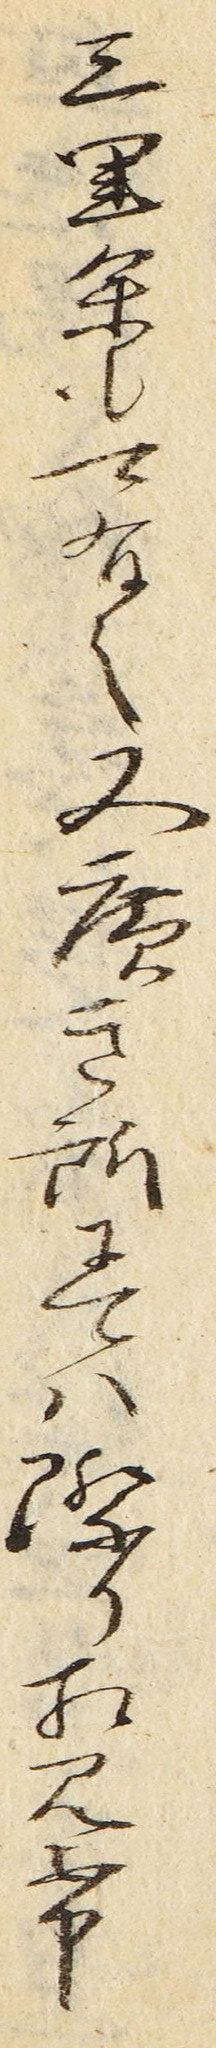三里余も可有之又広き所にては際り相見不申

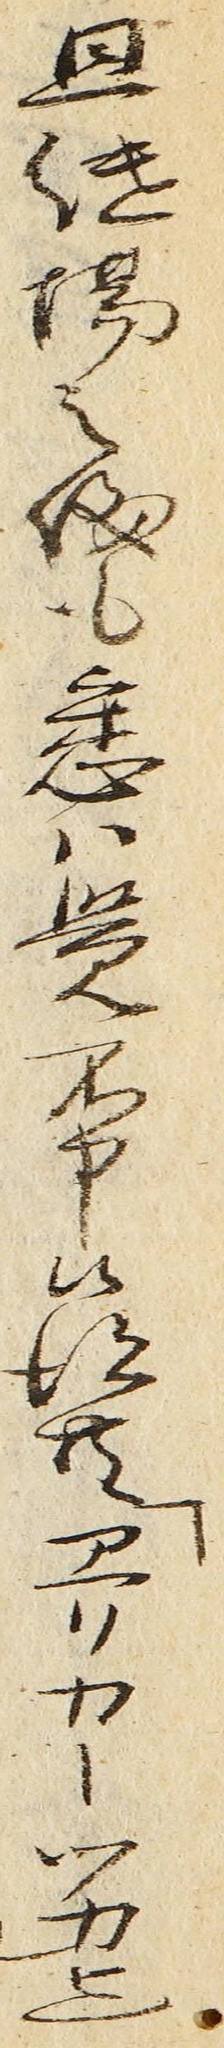且継場之儀も悉は覚不申候得共「ヱリカーツカ」迄
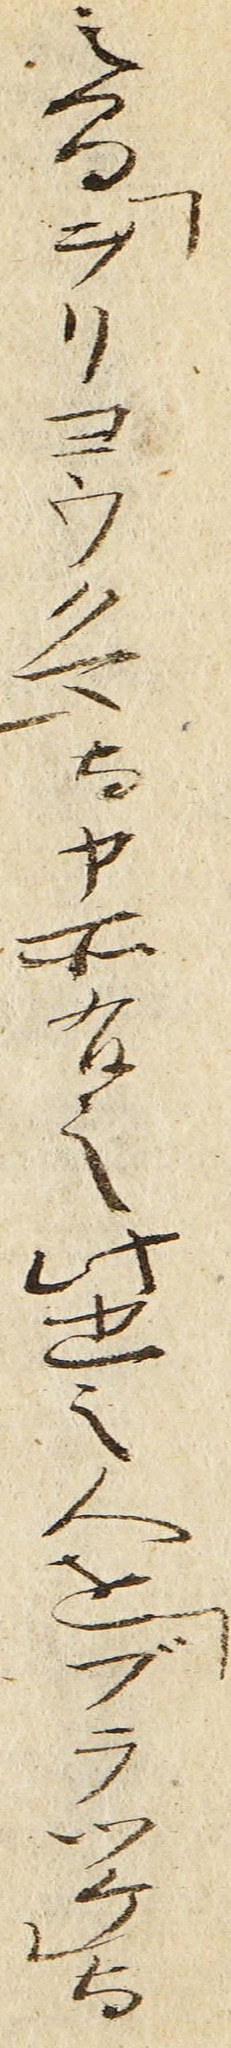之間「ヲリヨウクマ」と申所有之此辺之人を「ブラツケ」と
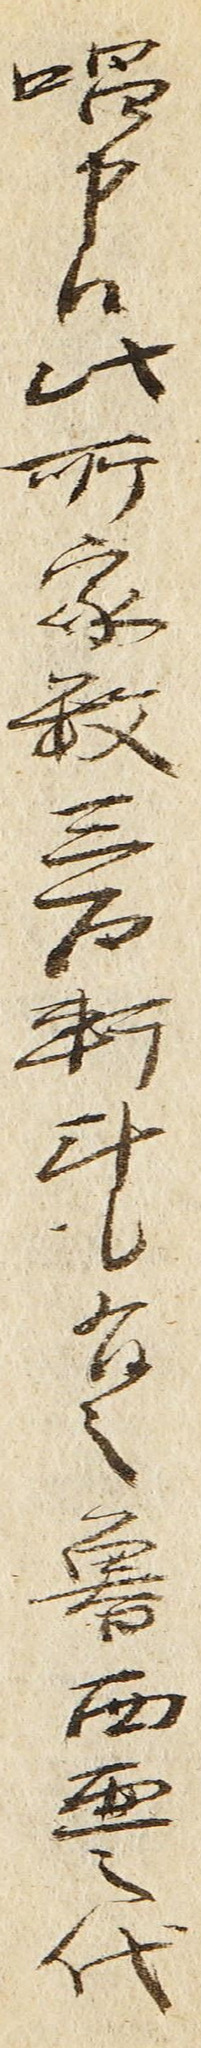唱申候此所家数三百軒斗も有之魯西亜之代
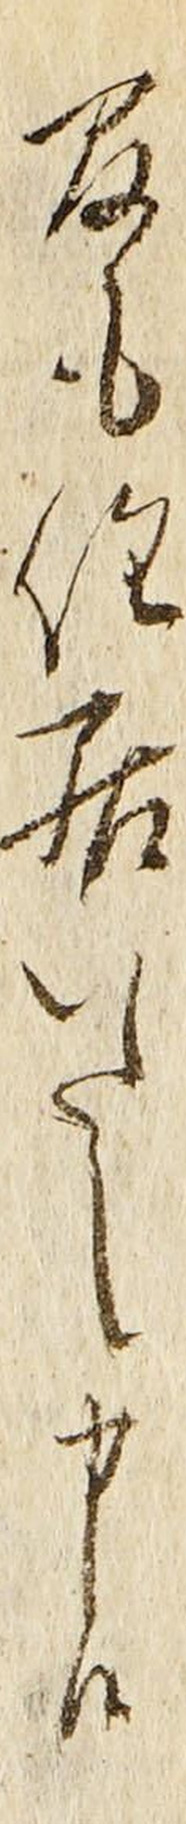官も住居いたし申候
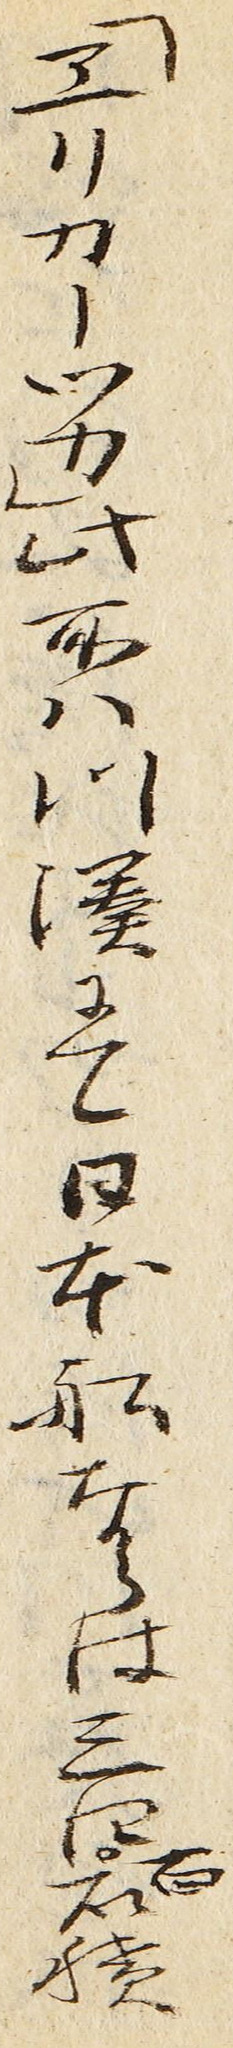「ヱリカーツカ」此所は川湊にて日本船ならは三四百石積
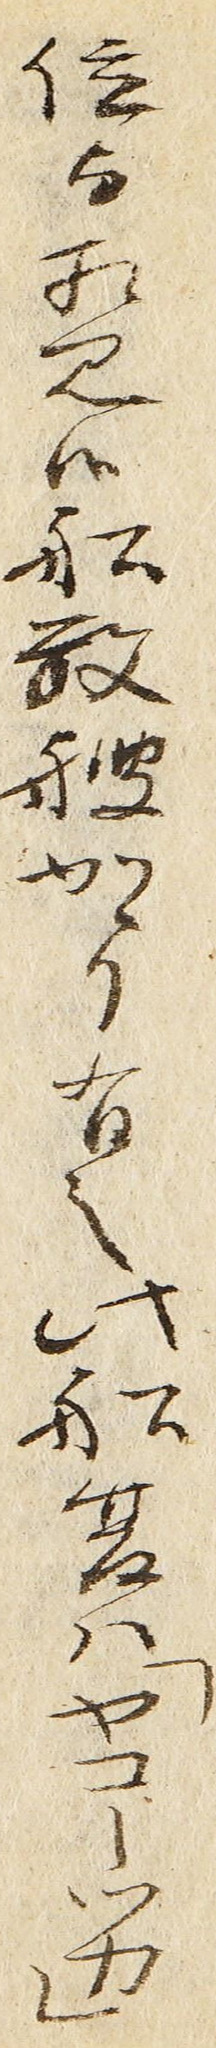位と相見候船数艘かゝり有之此船夏は「ヤコーツカ」
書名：漂民後記
